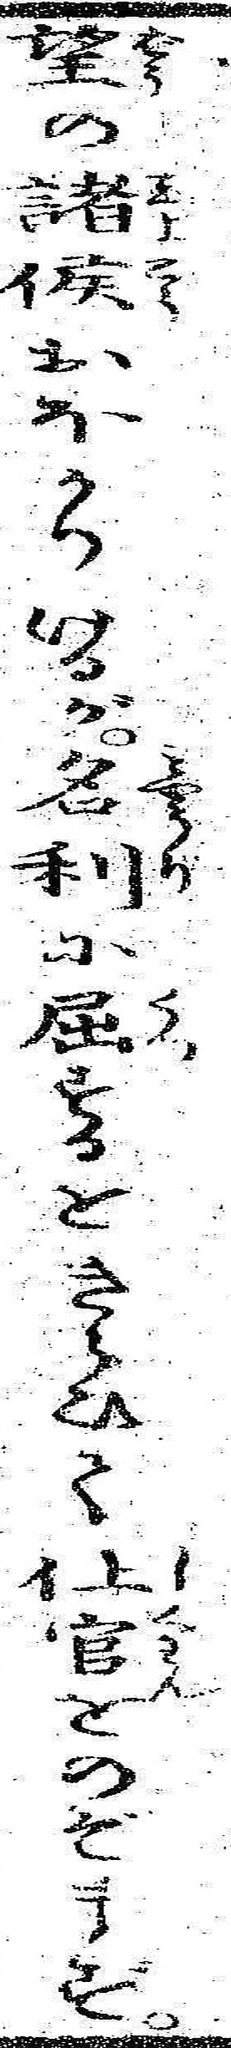望の諸侯おほかりけるが。名利に屈するをきらひて仕官をのぞまず。
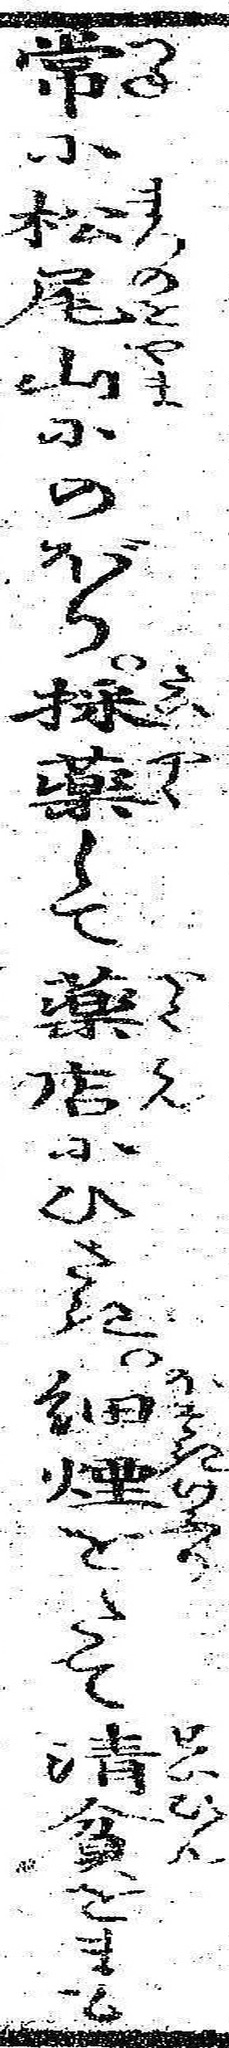常に松尾山にのぼり。採薬して薬店にひさき。細煙をたて清貧をまも
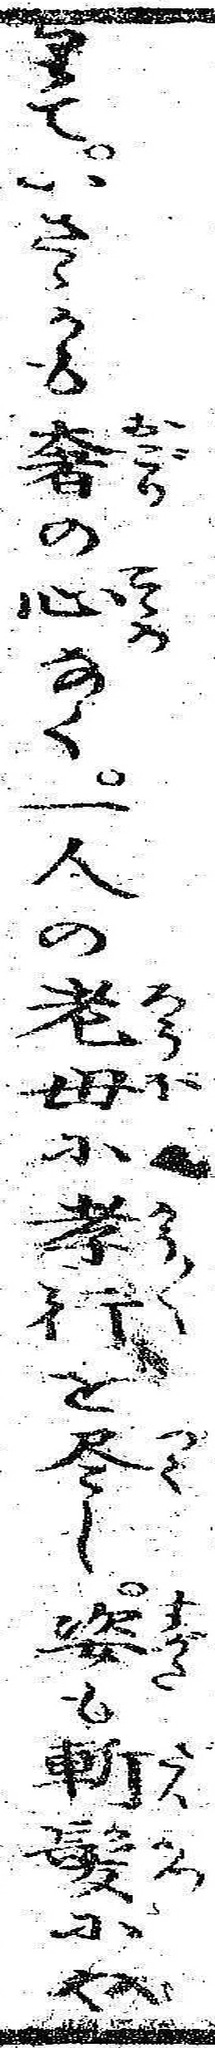りて。いさゝかも奢の心なく。一人の老母に孝行を尽し。姿も斬髪にや
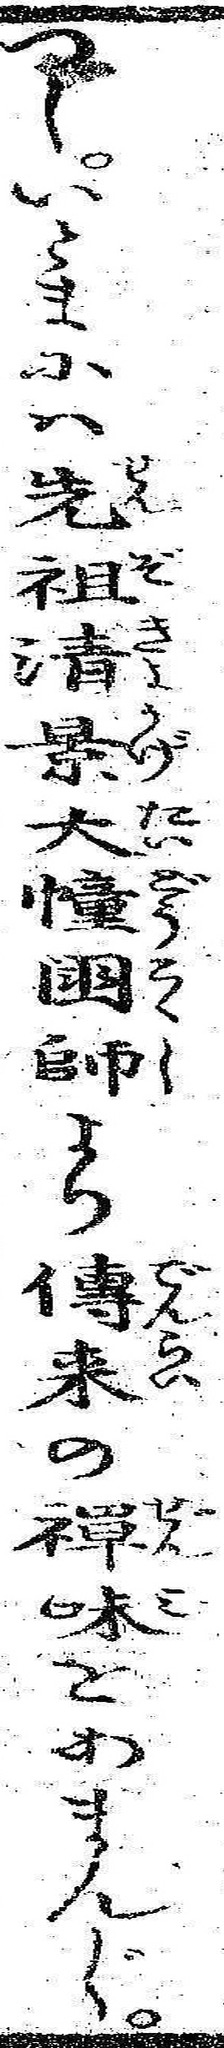つし。いとまには先祖清景大幢国師より伝来の禅味をあまんじ。
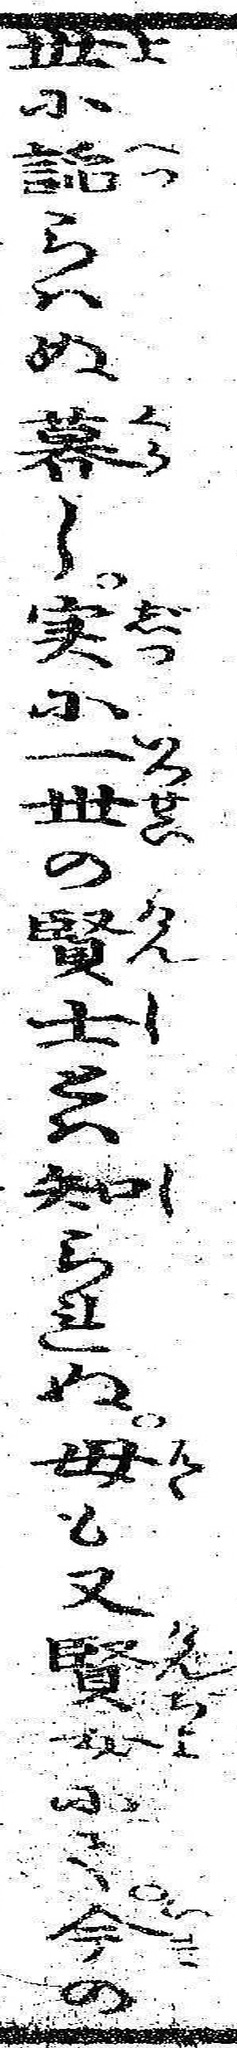世に諂らはぬ暮し。実に一世の賢士とは知られぬ。母も又賢女にて。今の
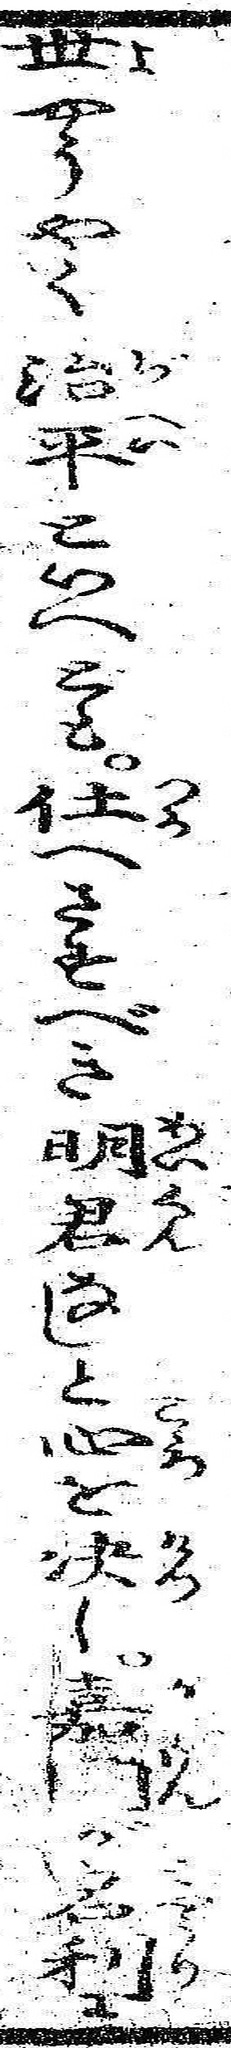世やうやく治平といへとも。仕へさすべき明君なしと心を決し。嘉門が名利に
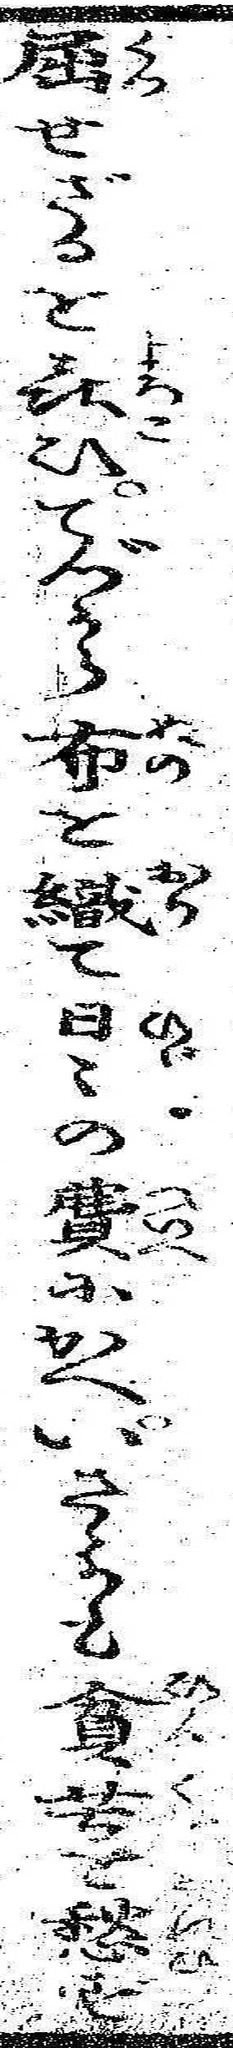屈せざるを喜ひ。てづから布を織て日々の費にかへ。いさゝかも貧苦を愁ず
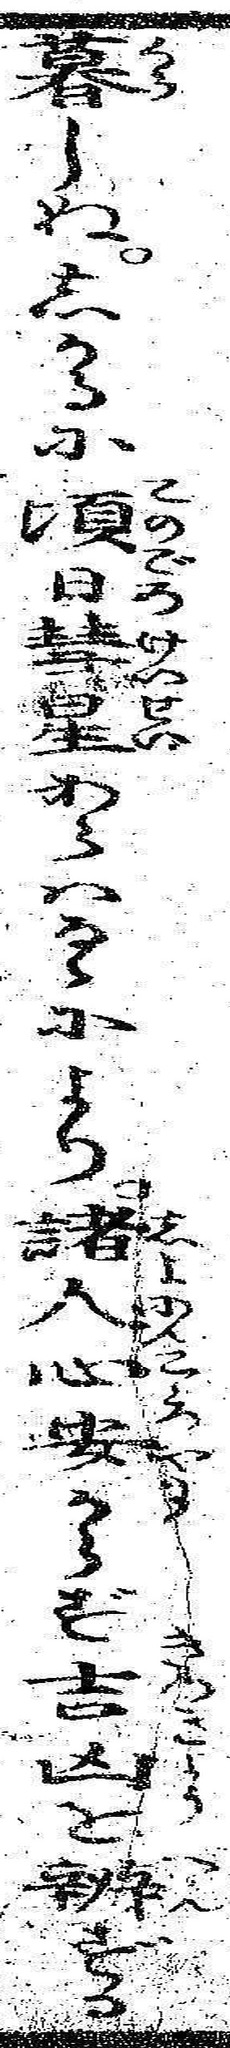暮しぬ。しかるに頃日彗星あらはるゝにより。諸人心安からず吉凶を弁ずる
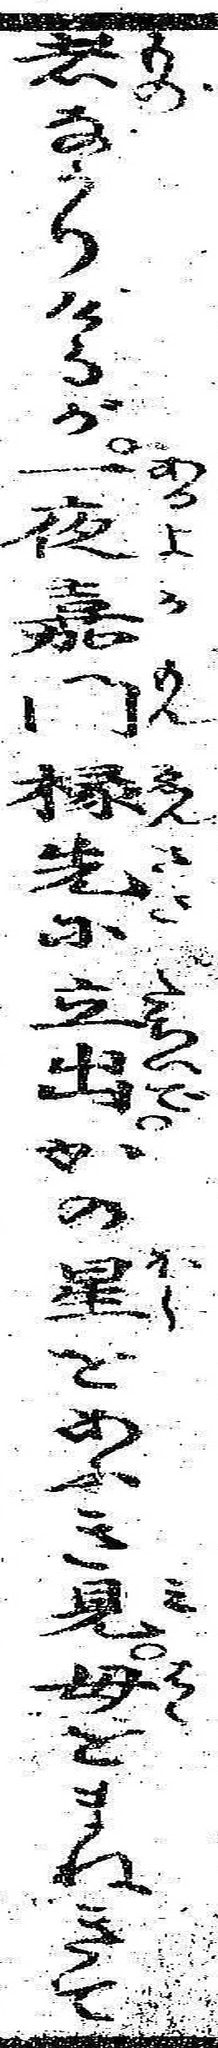者なかりけるが。一夜嘉門椽先に立出。かの星をあふき見。母をまねきて

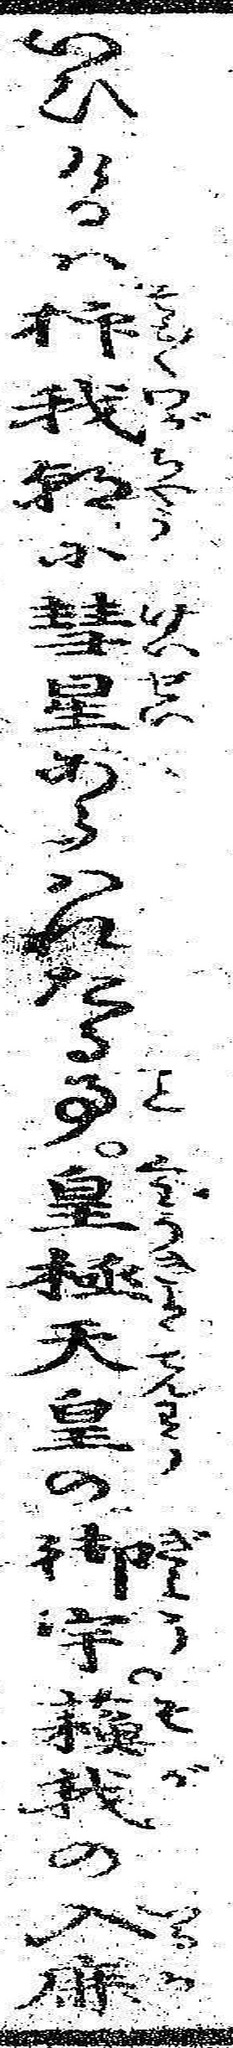いひけるは。抑我朝に彗星あらはれたる事。皇極天皇の御宇。蘇我の入鹿
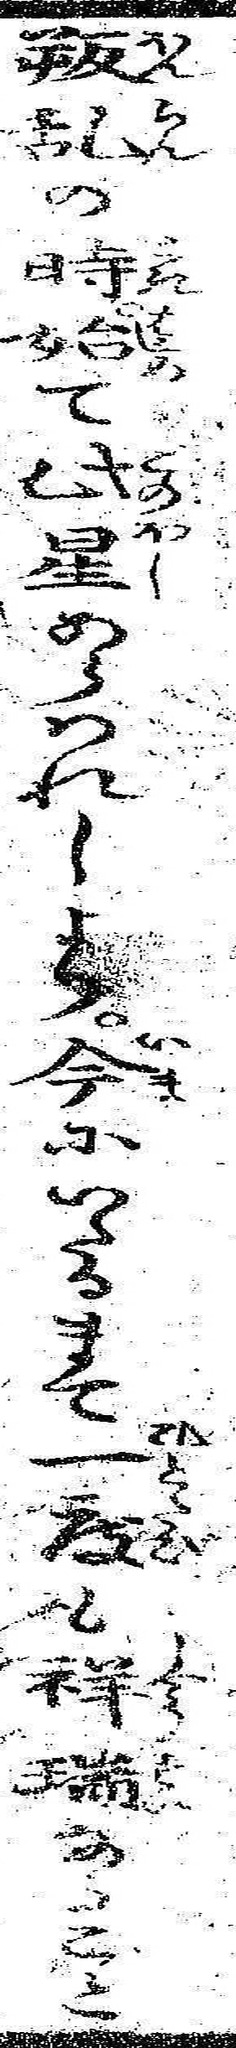叛乱の時。始て此星あらはれしより。今にいたるまて一度も祥端なること
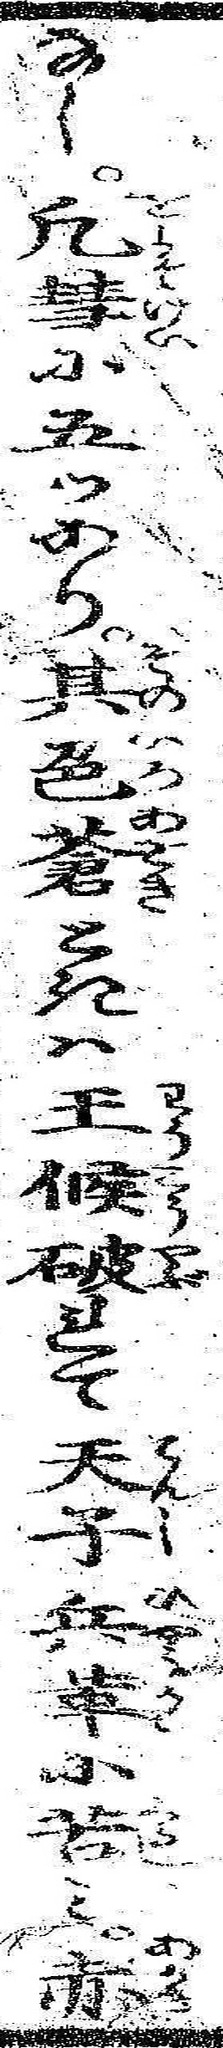なし。凡彗に五ツあり。其色蒼ときは王候破れて天子兵革に苦み。赤
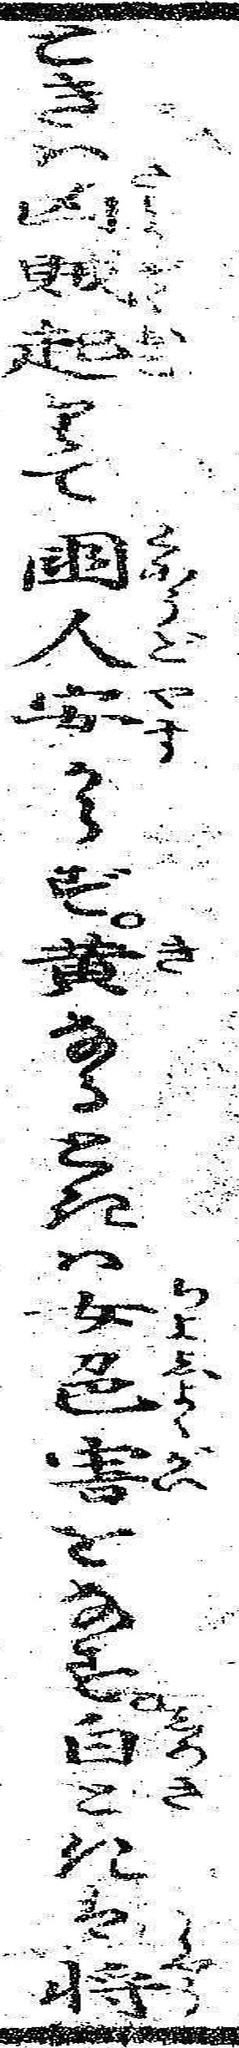ときは凶賊起りて国人安からず。黄なるときは女色害をなす。白ときは将
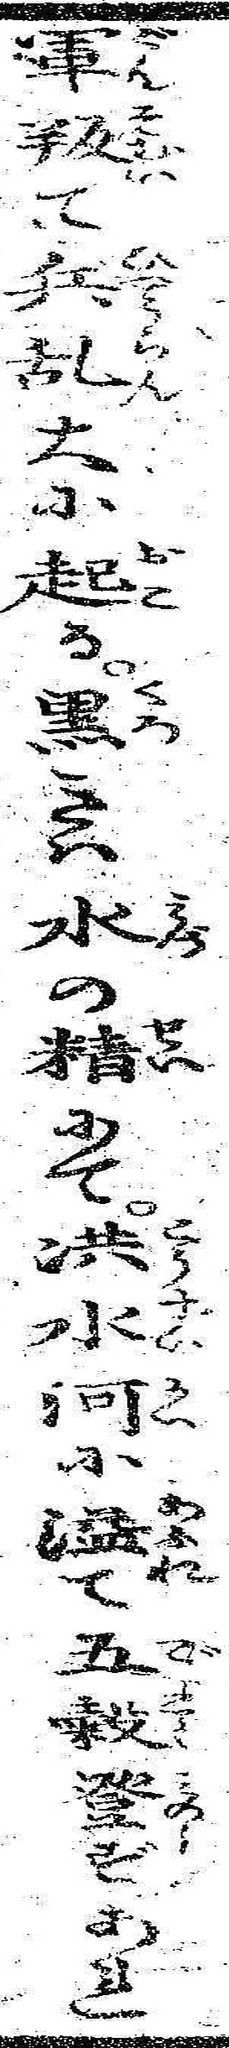軍叛て兵乱大に起る。黒きは水の精にて。洪水河に溢て五穀登ずあれ
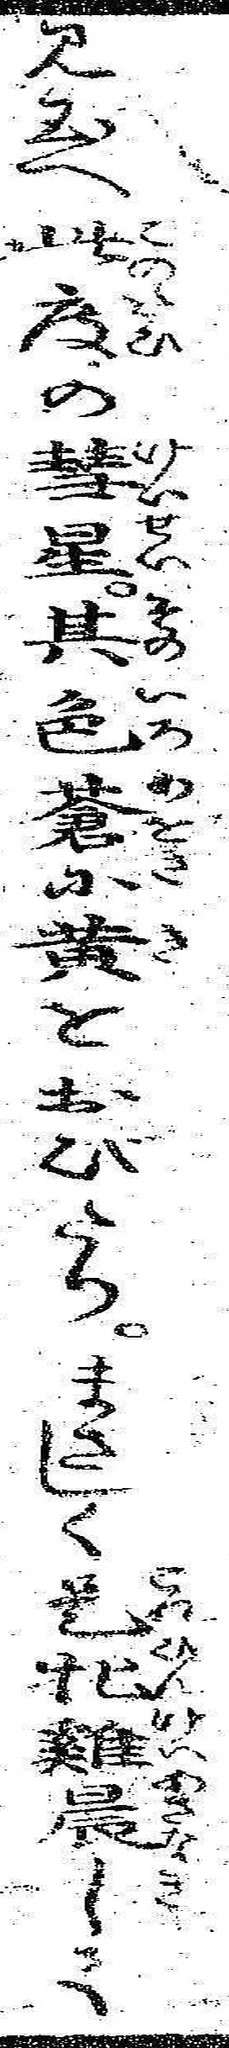見玉へ此度の彗星。其色蒼に黄をおびたり。まさしく是牝鶏晨して
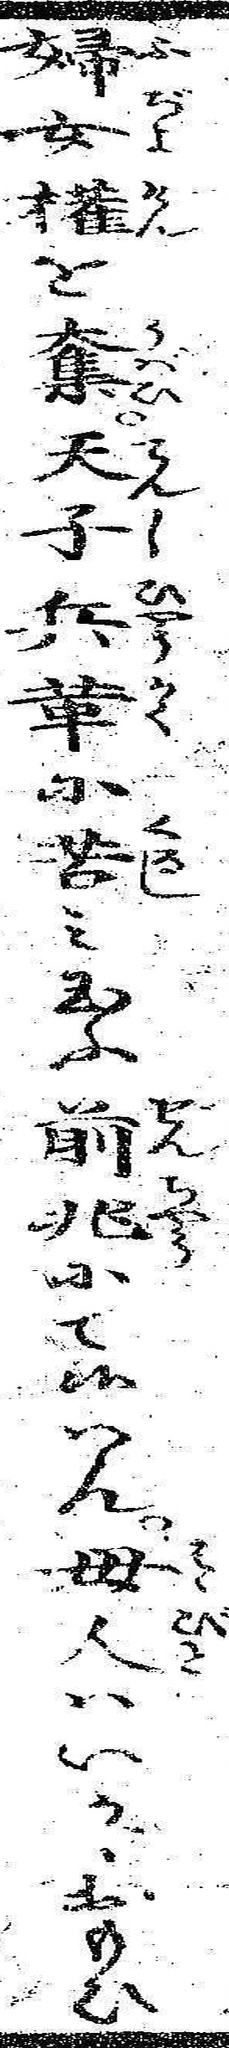婦女権を奪。天子兵革に苦み玉ふ前兆にて候はん。母人はいかゝおもひ
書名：昔話稲妻表紙
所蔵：国文学研究資料館
